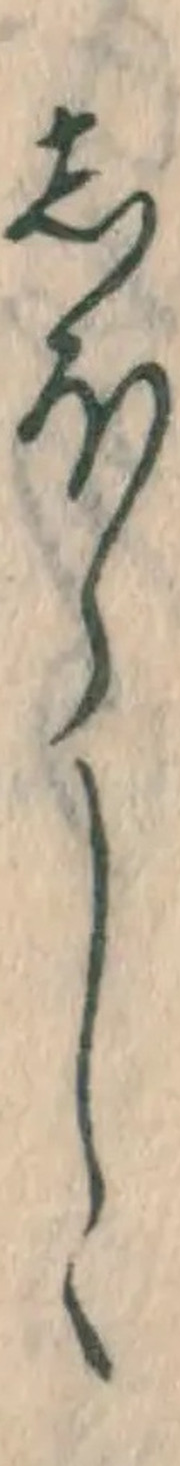しほらし

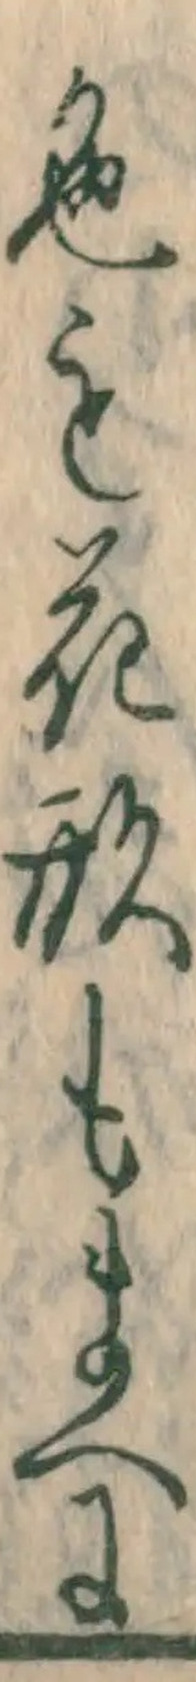色も花形もまへに
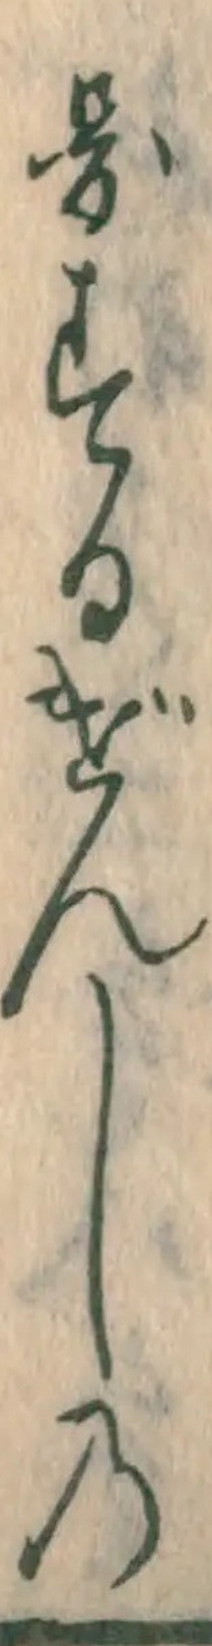図するげんしの
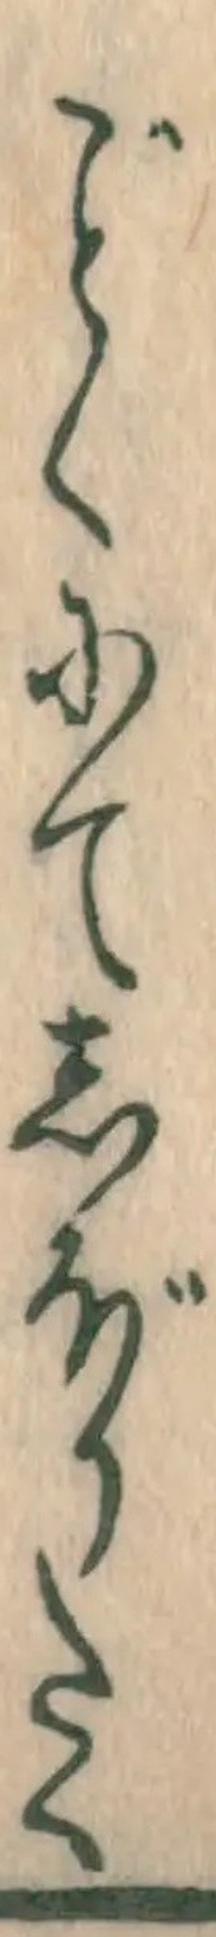ごとくにてしぼりたく
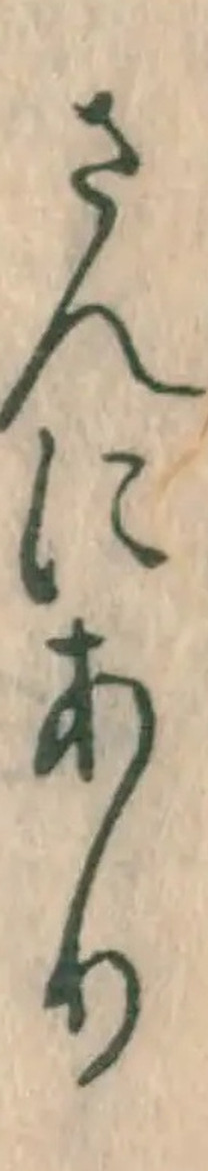さんにあり
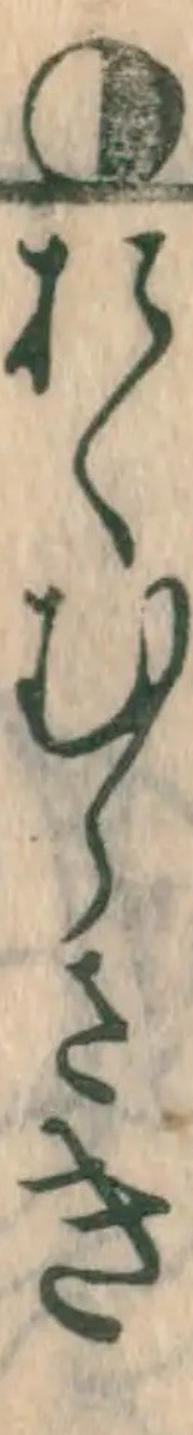おくむらさき
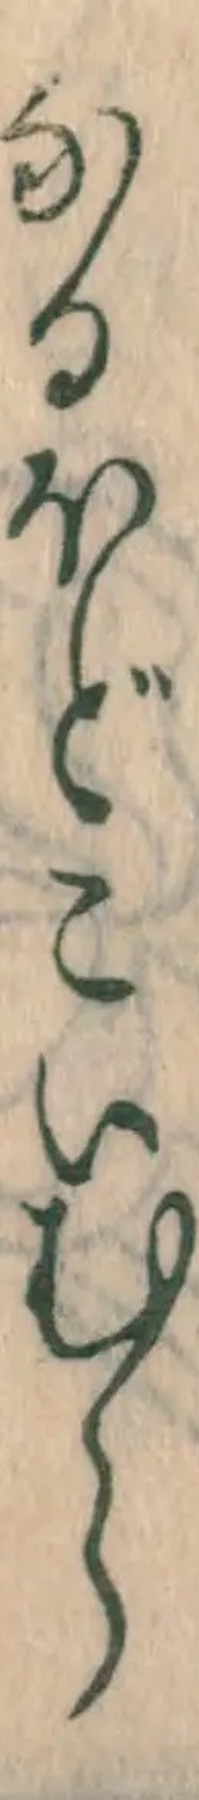なるほどこいむら
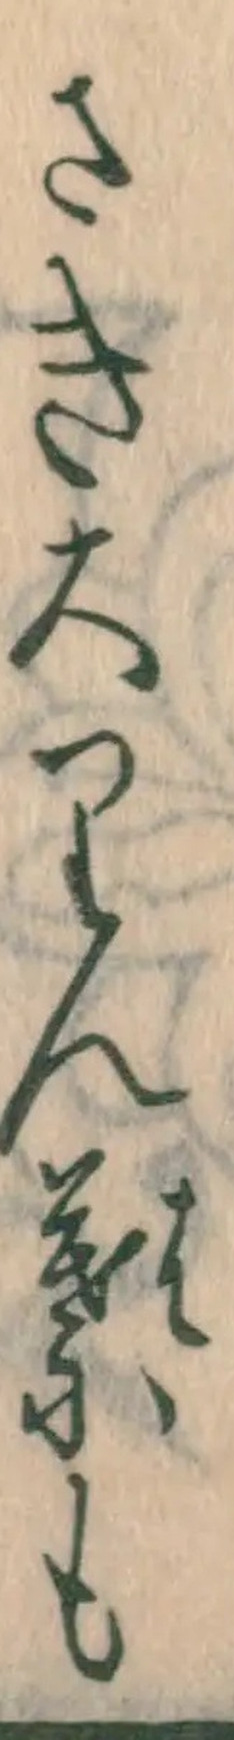さき大りん葉も
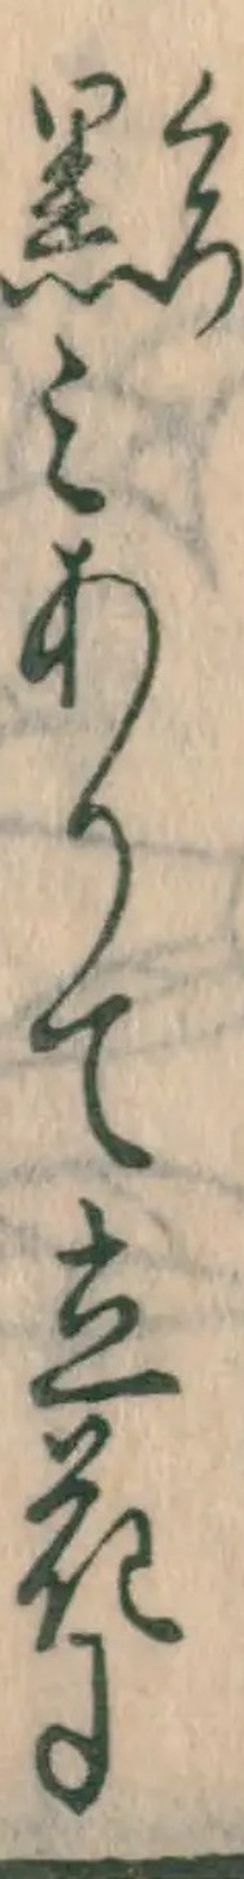黒みありて立花に
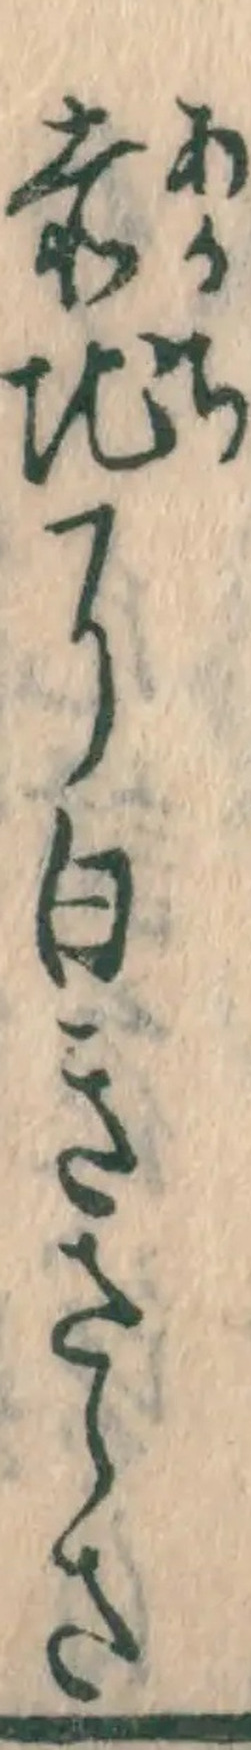赤地に白きさらさ
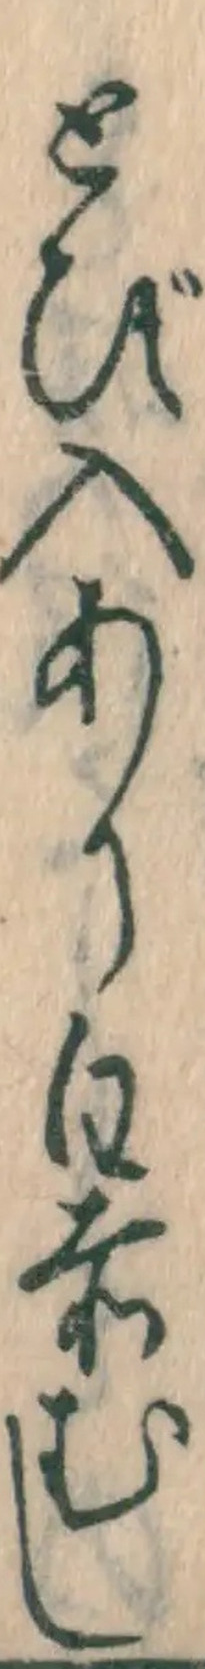とび入あり白赤むし

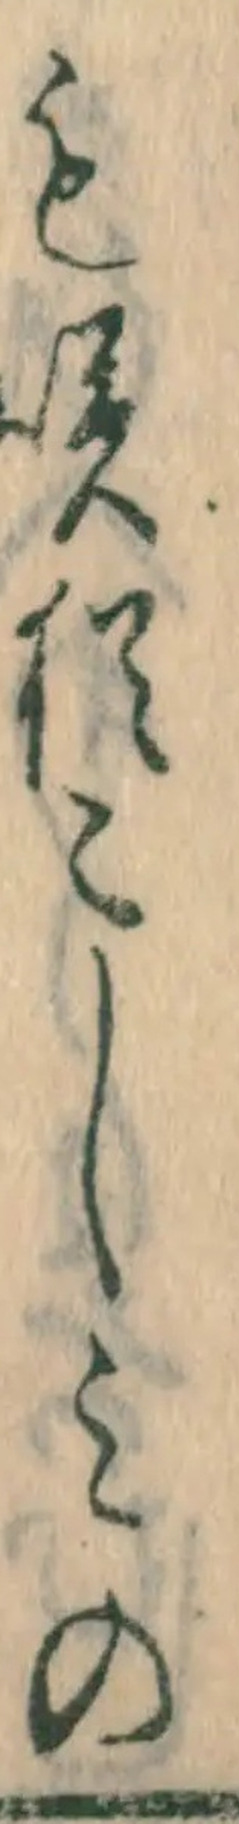も咲猶こしみの
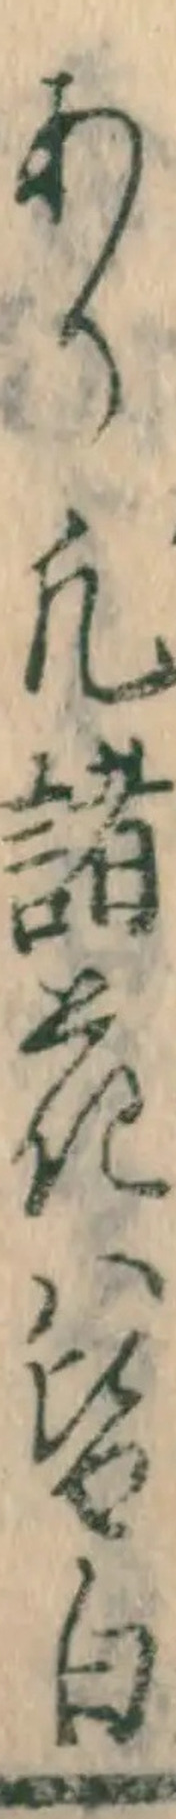あり凡諸花は皆白
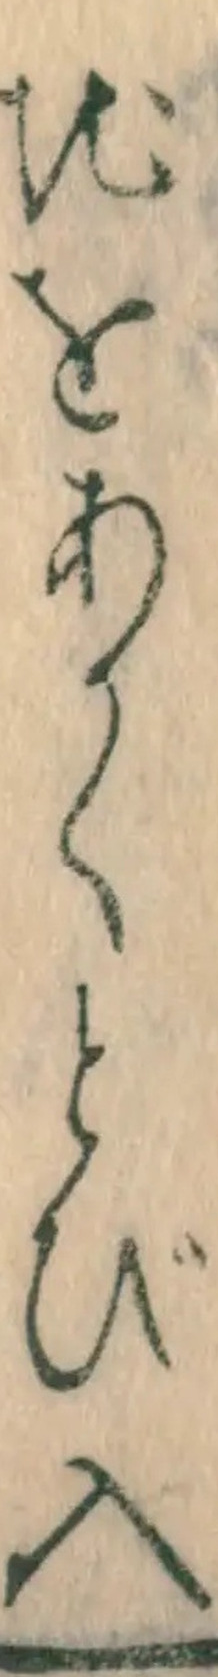地をあかくとび入
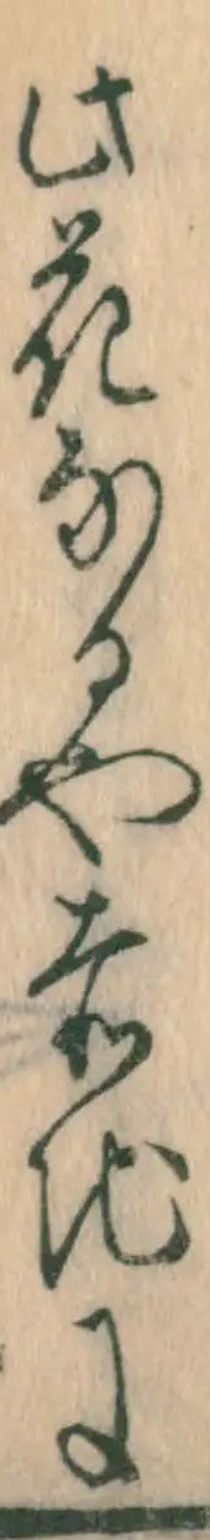此花なるや赤地に
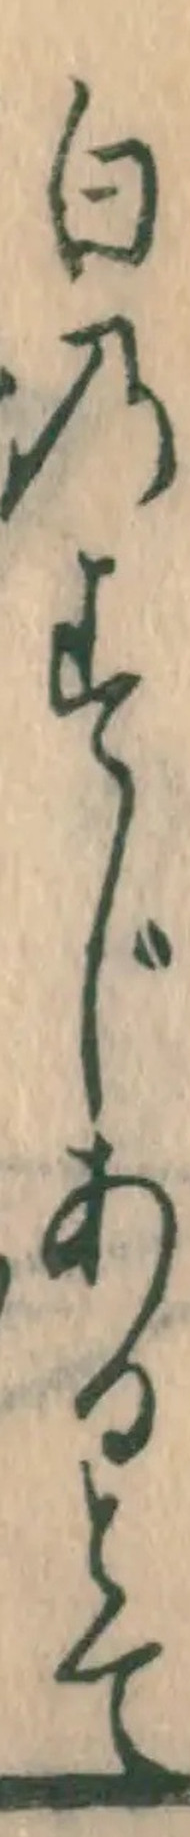白のすじあるとて
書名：錦繍枕 5巻. [5]
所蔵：国立国会図書館 National Diet Library, JAPAN
